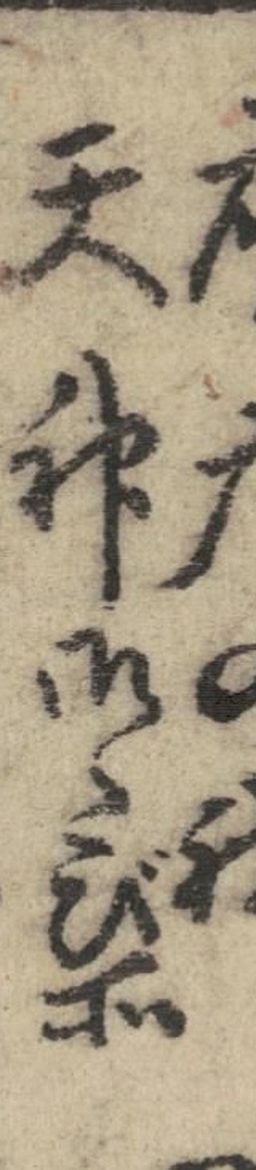天神御たび所
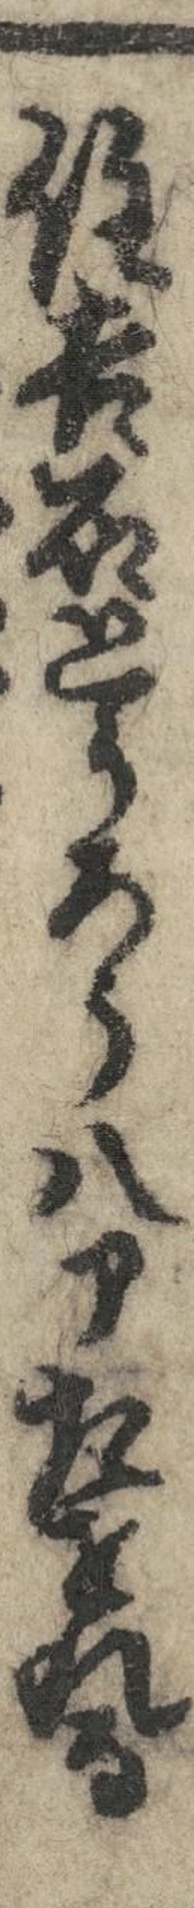住吉石とうろう八部たをれる
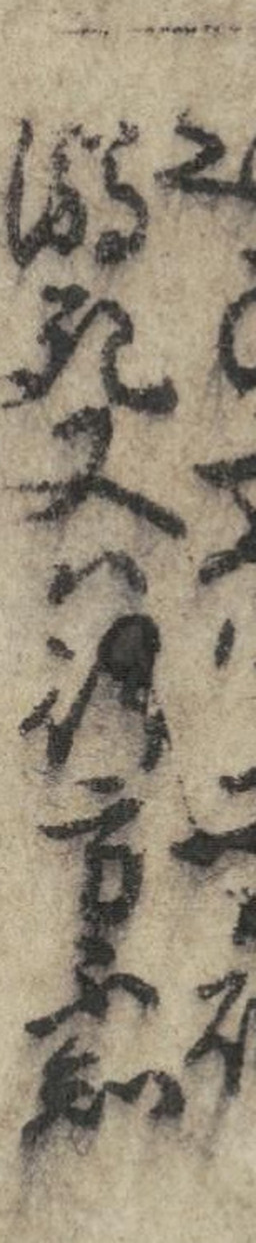溺死又は行方不知
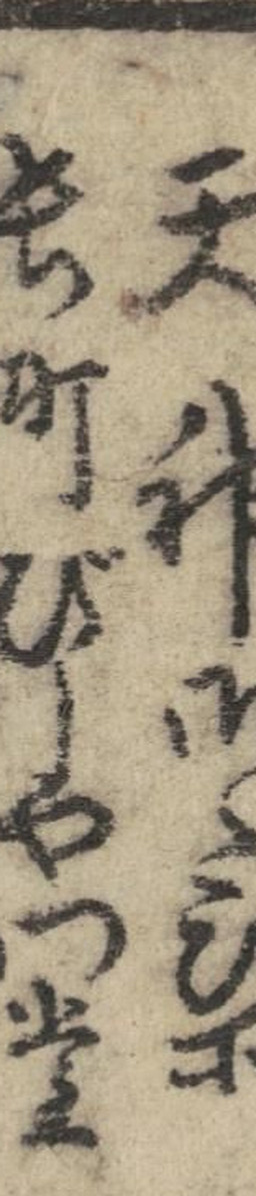長町びしや門堂
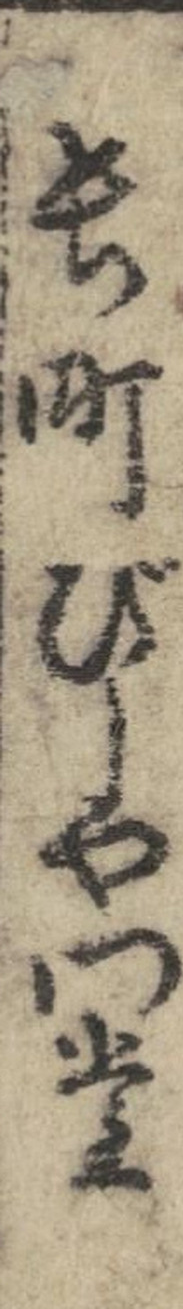長町びしや門堂
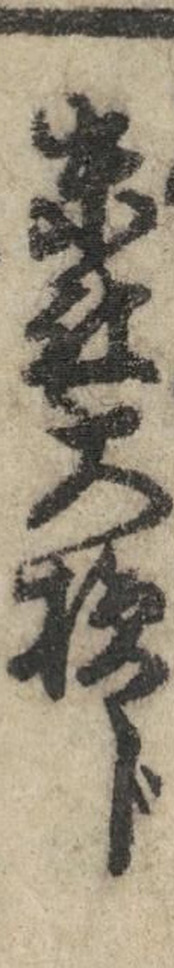末社大損じ
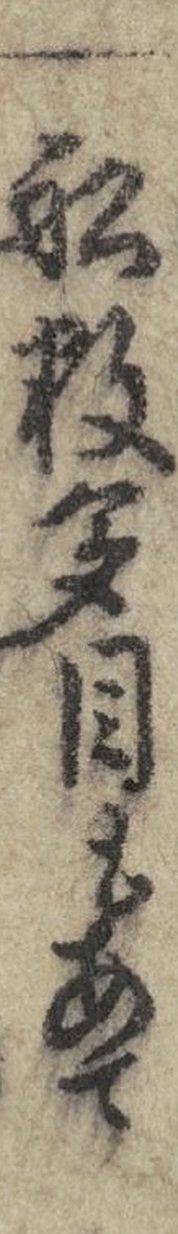船数多目もあて
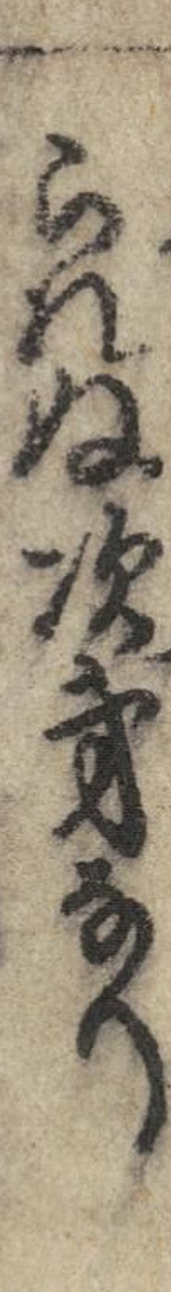られぬ次第なり
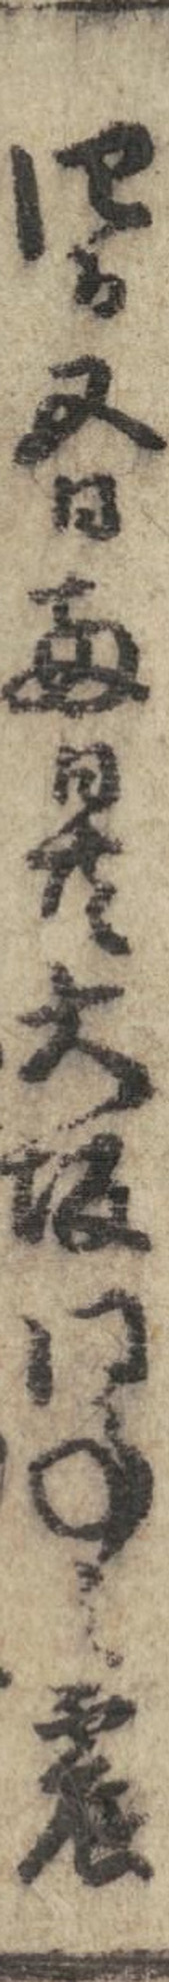四日五日両日共大坂同事之震
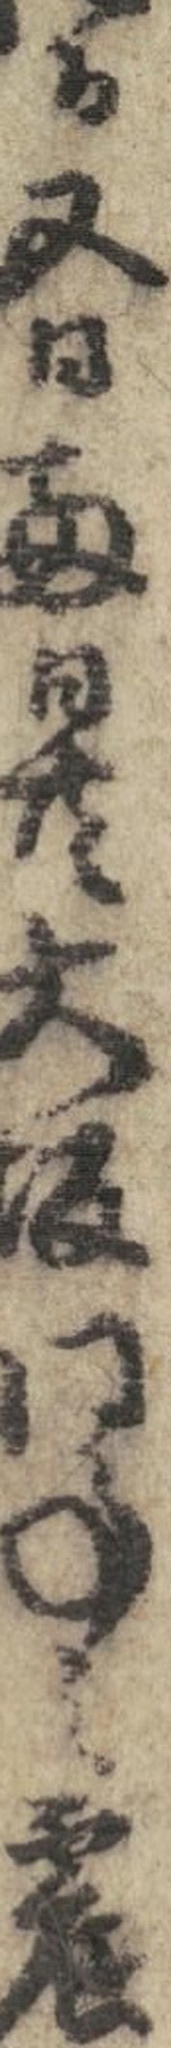四日五日両日共大坂同事之震
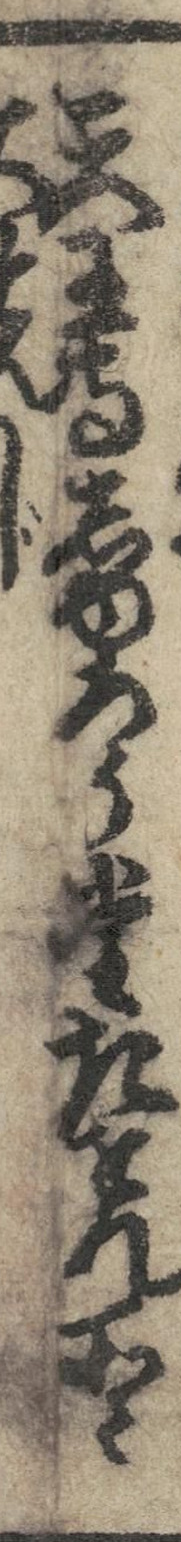天王寺しゆろう堂たをれ所〻
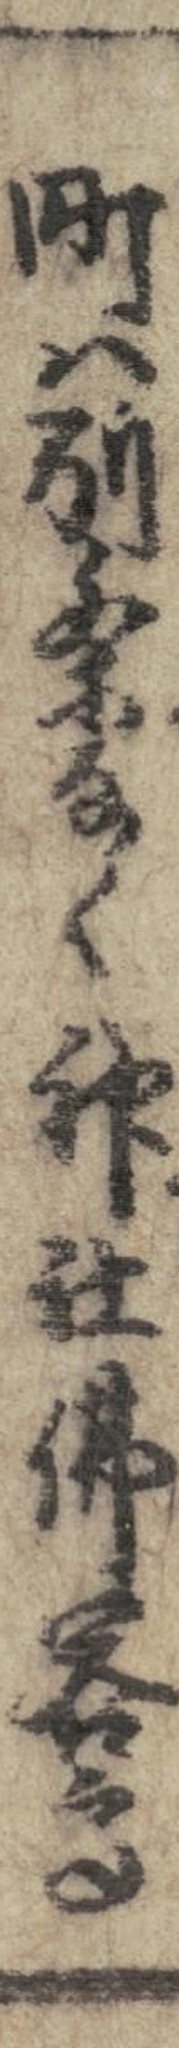町は別条なく神社仏閣高
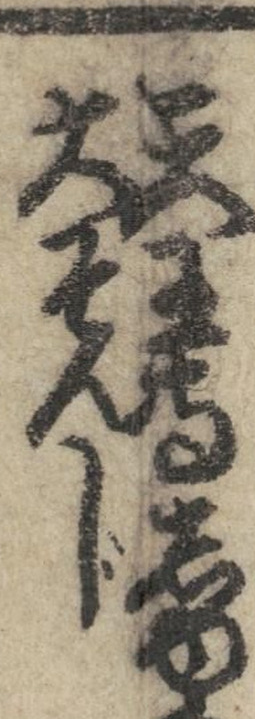大そんじ
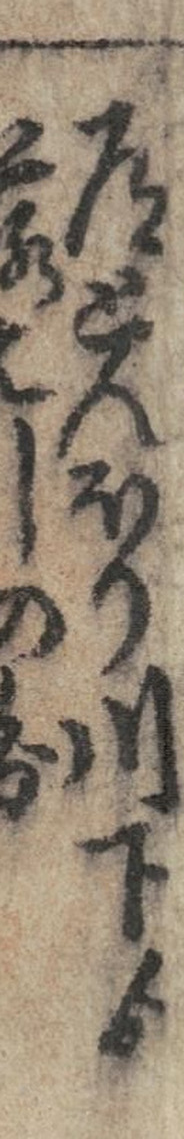道とんほり川下ゟ
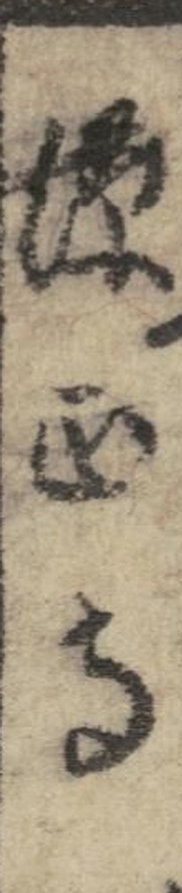順正寺
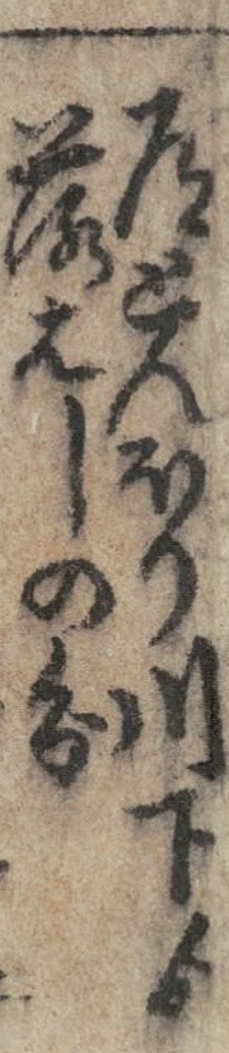落はしの分
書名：諸国大阪太地震大つなミ末代噺
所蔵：東京大学地震研究所図書室 Earthquake Research Institute Library, The University of Tokyo, JAPAN
